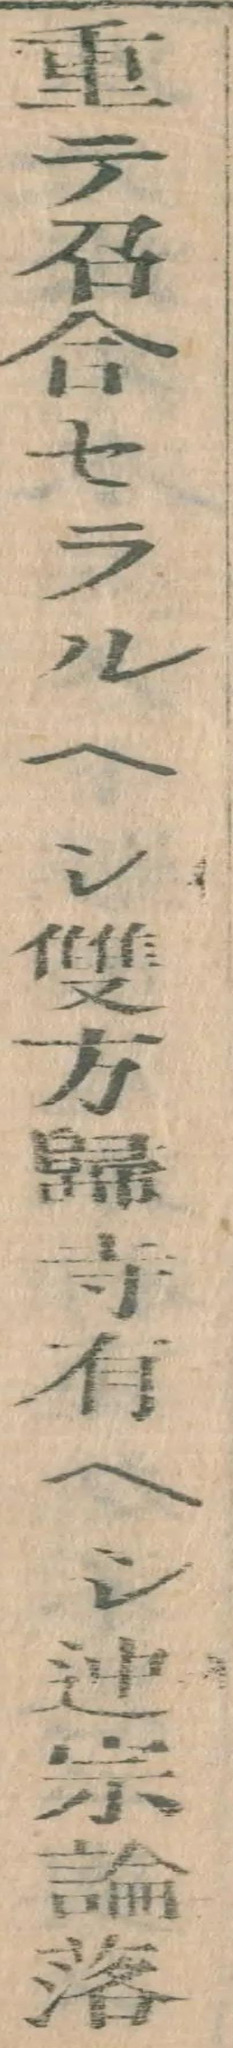重テ召合セラルヘシ双方帰寺有ヘシ迚宗論落
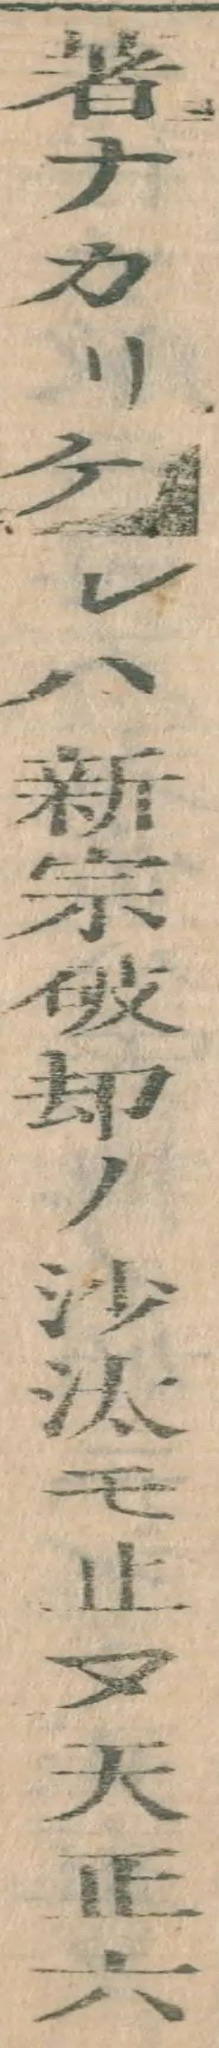著ナカリケレハ新宗破却ノ沙汰モ止ヌ天正六
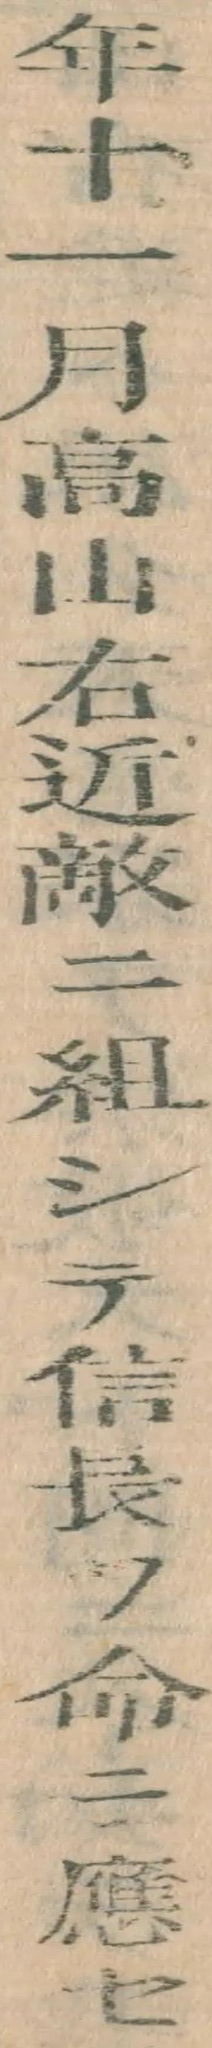年十一月高山右近敵ニ組シテ信長ノ命ニ応セ
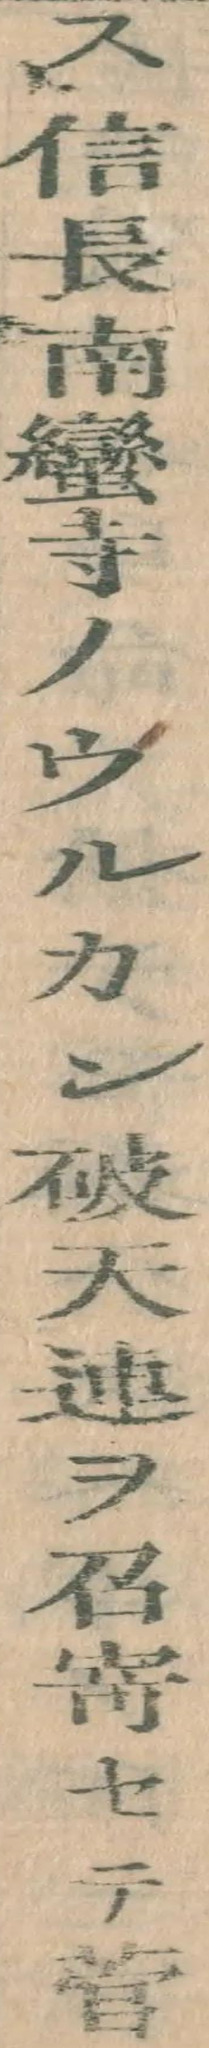ス信長南蛮寺ノウルカン破天連ヲ召寄セテ菅
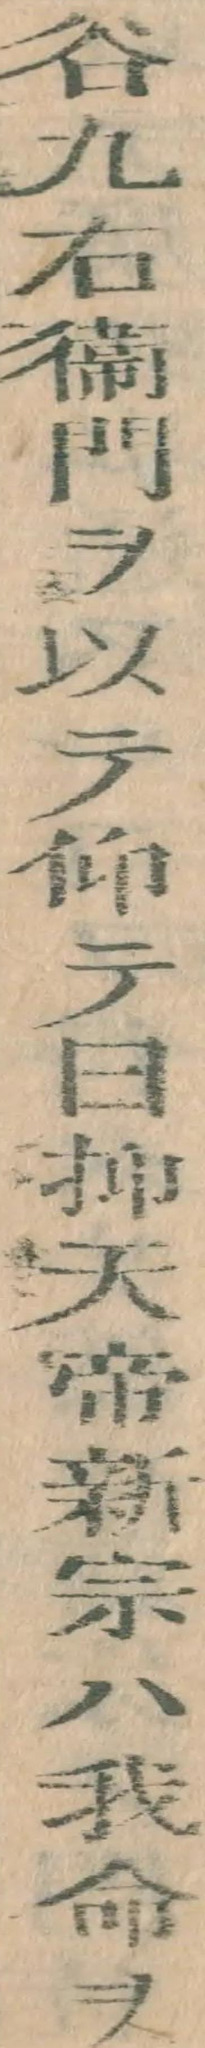谷九右衛門ヲ以テ仰テ曰抑天帝新宗ハ我命ヲ

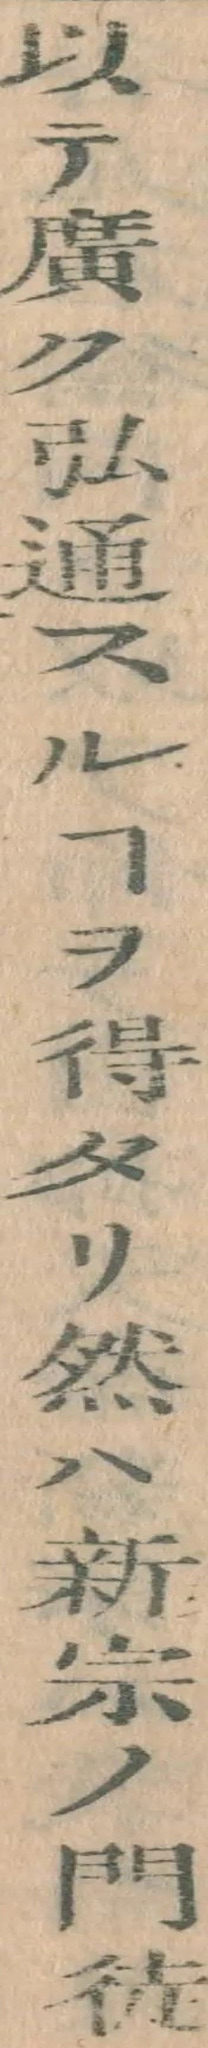以テ広ク弘通スルヿヲ得タリ然ハ新宗ノ門徒
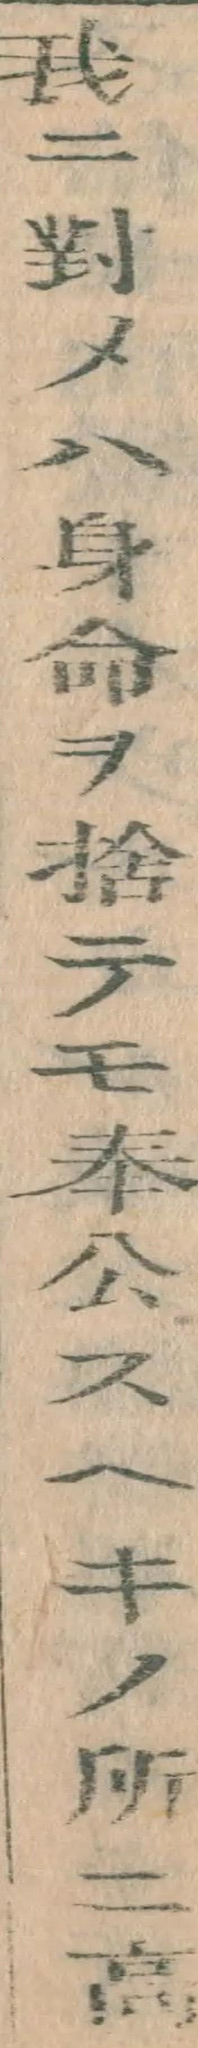我ニ対シテハ身命ヲ捨テモ奉公スヘキノ所ニ高
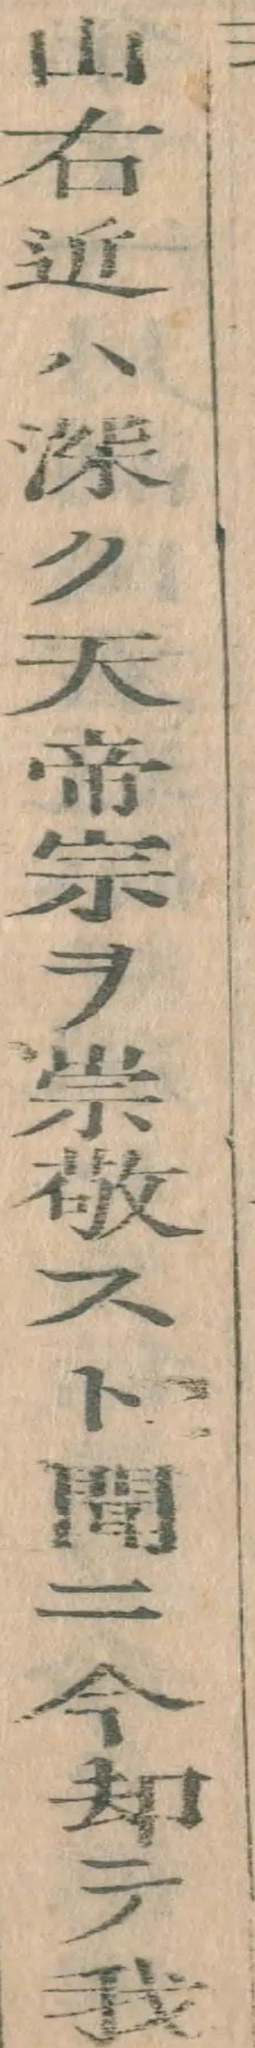山右近ハ深ク天帝宗ヲ崇敬スト聞ニ今却テ我
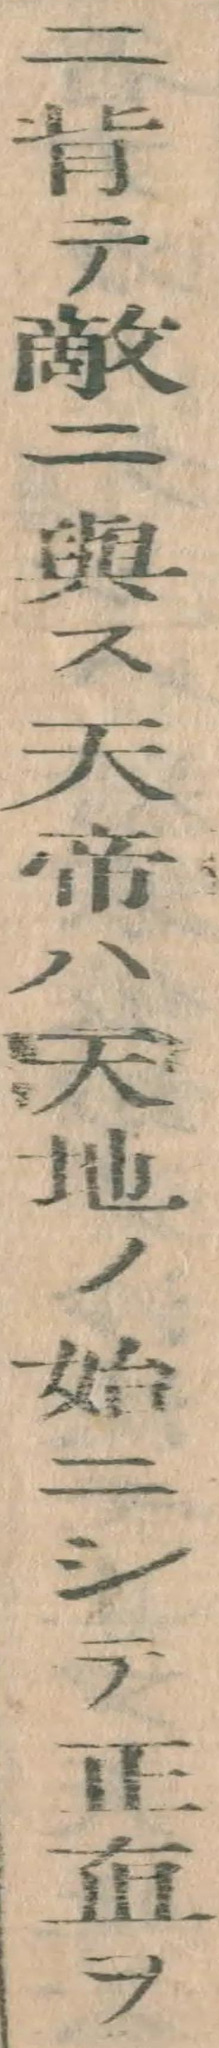ニ背テ敵ニ与ス天帝ハ天地ノ始ニシテ正直ヲ
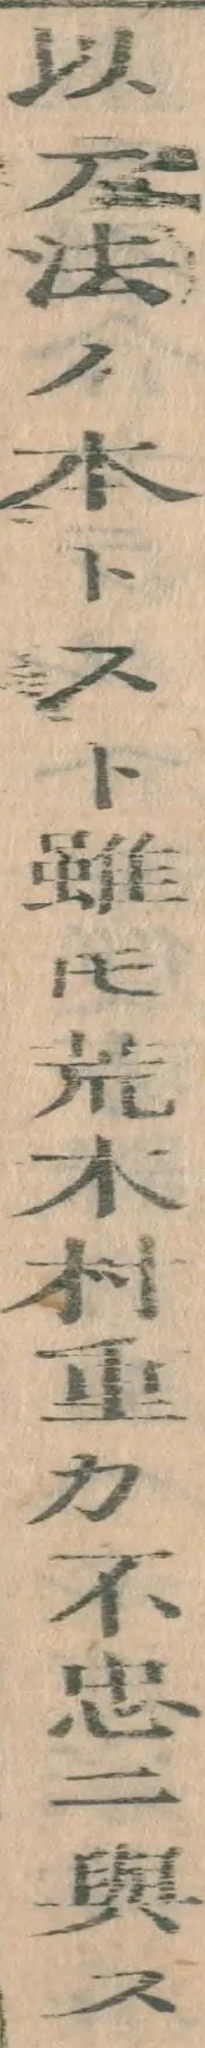以テ法ノ本トスト雖トモ荒木村重カ不忠ニ与ス
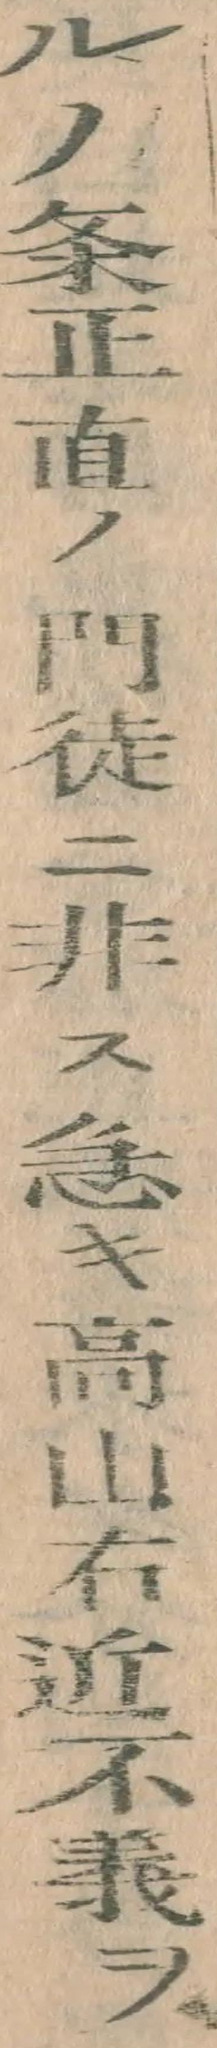ルノ条正直ノ門徒ニ非ス急キ高山右近不義ヲ
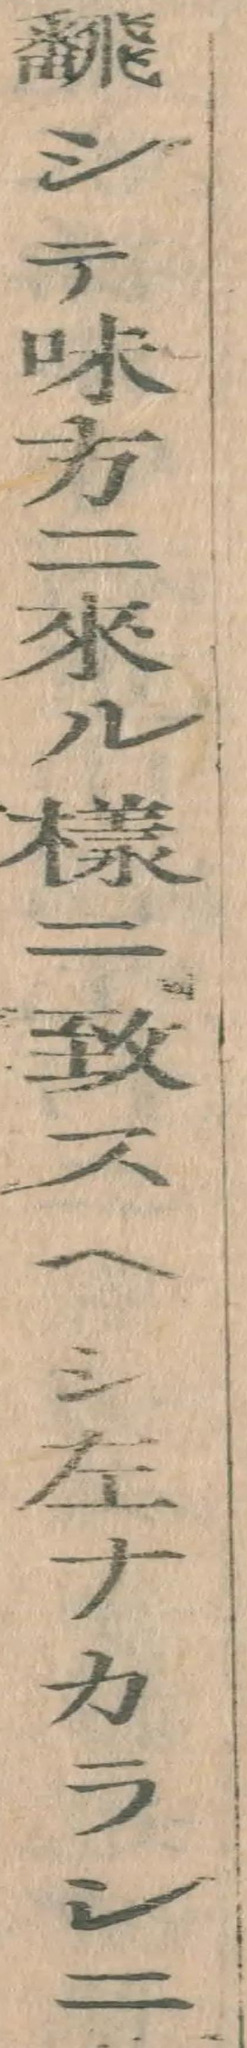翻シテ味方ニ来ル様ニ致スヘシ左ナカランニ
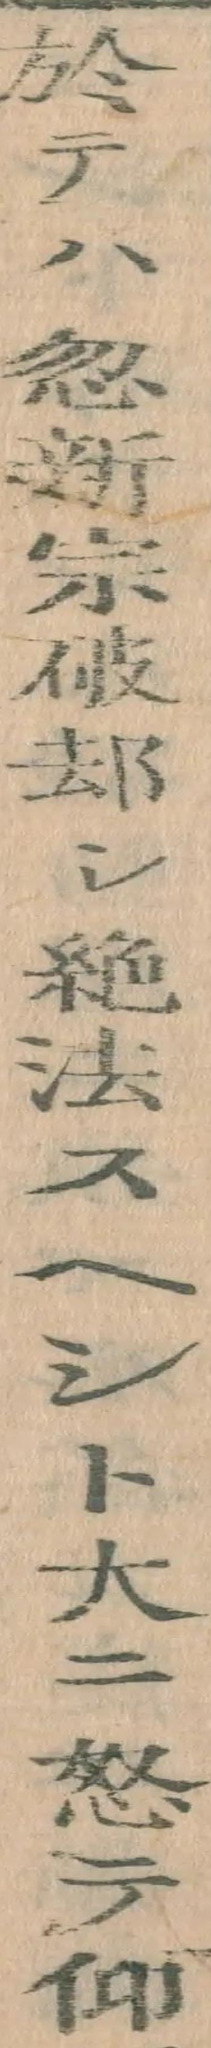於テハ忽新宗破却シ絶法スヘシト大ニ怒テ仰
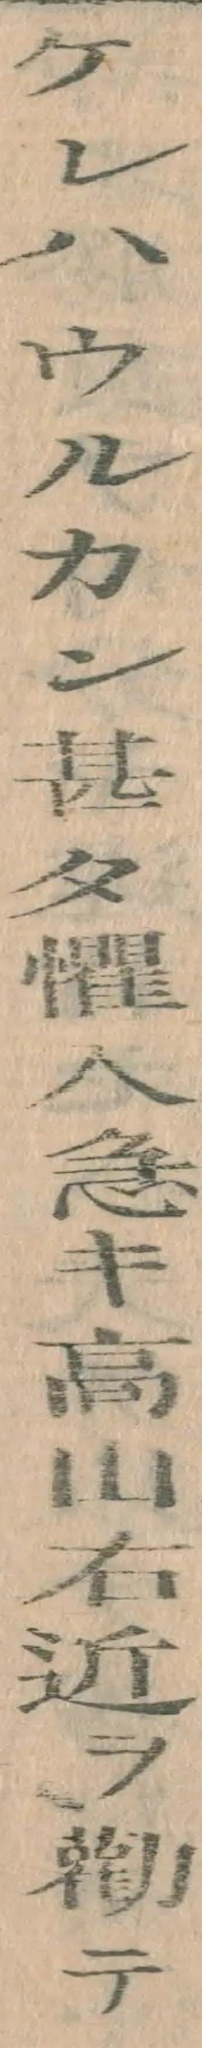ケレハウルカン甚タ懼ヘ急キ高山右近ヲ勧テ
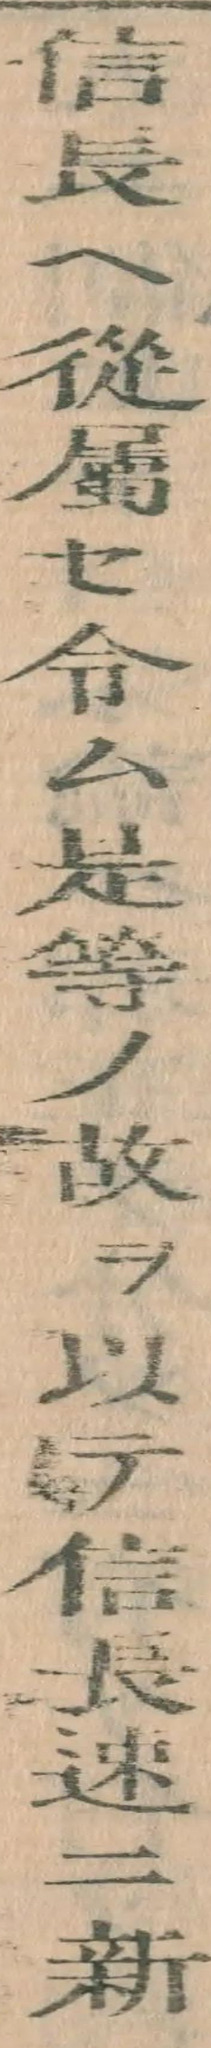信長ヘ従属セ令ム是等ノ故ヲ以テ信長速ニ新
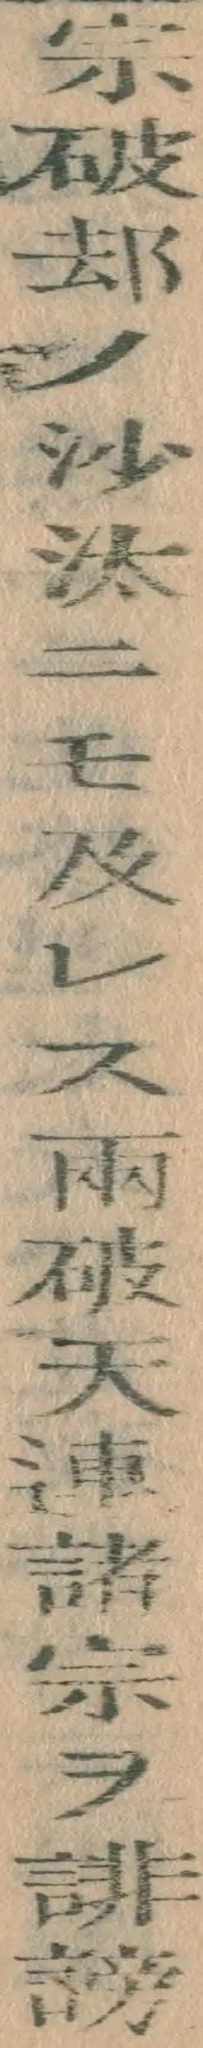宗破却ノ沙汰ニモ及レス両破天連諸宗ヲ誹謗
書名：南蛮寺興廃記
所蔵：国立国会図書館 National Diet Library, JAPAN
